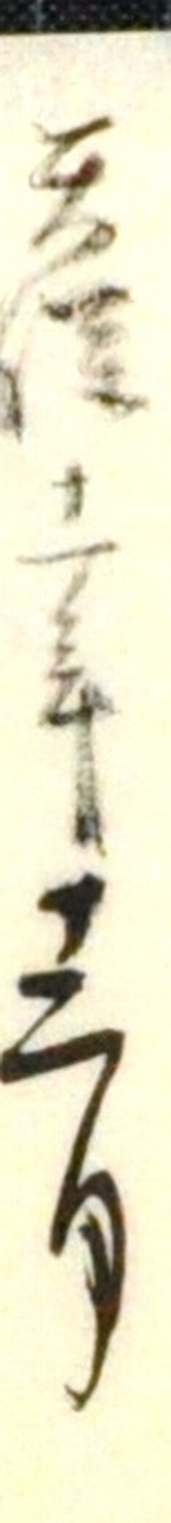天保十一年十二月
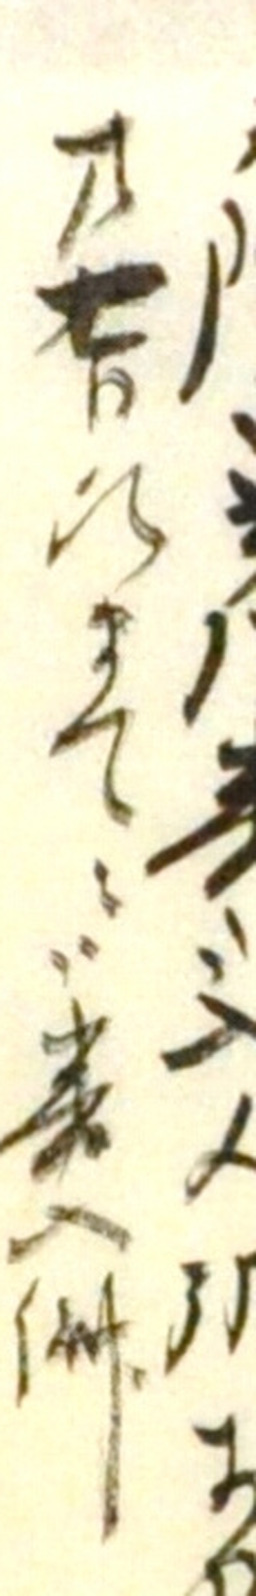廿七日頃まてに御番入済
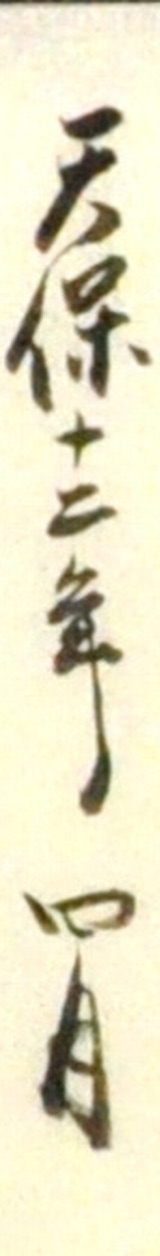天保十二年四月
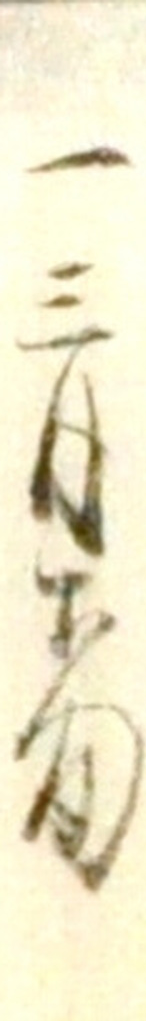一三月下旬
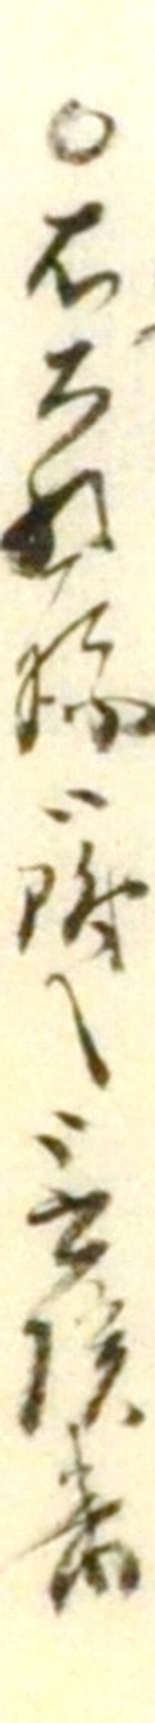○右大将様御附之御書院番
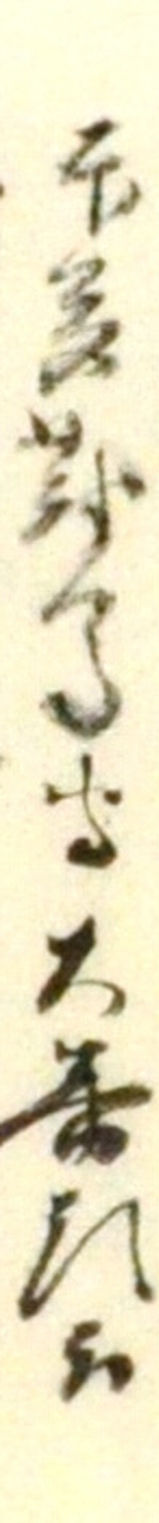本多対馬守大番頭被
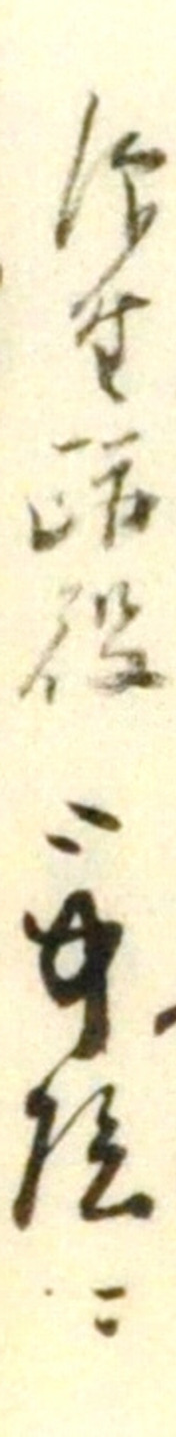仰付跡役御中陰に
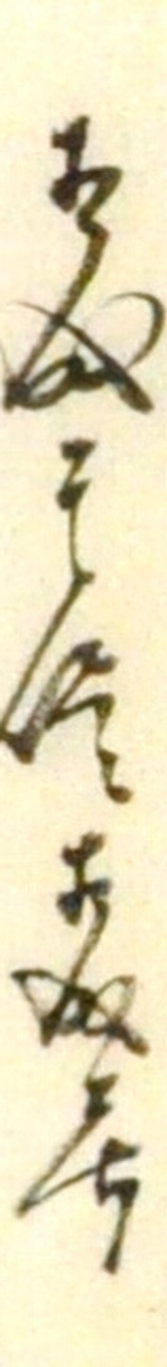相成其儘相成居候
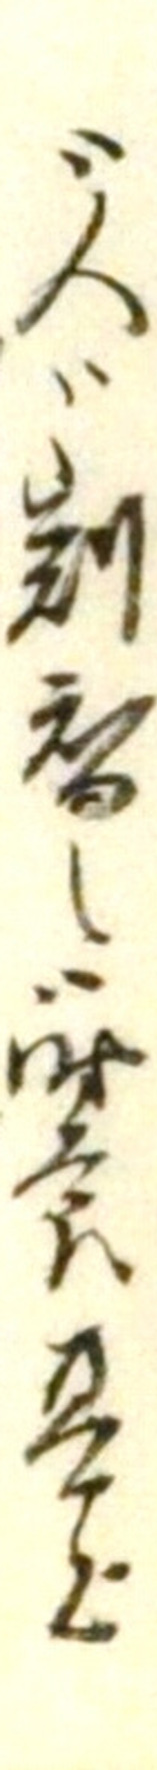御人御割替之御時節其上

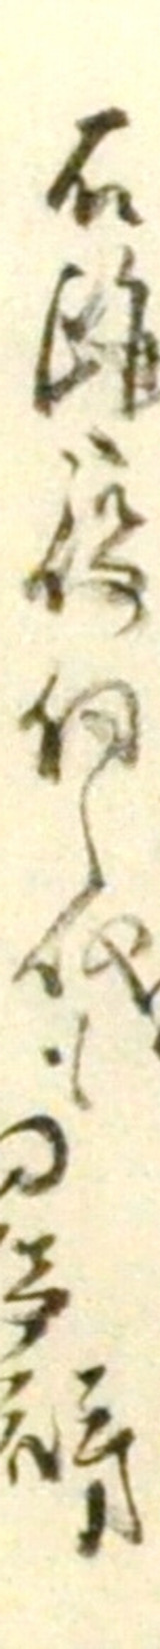右跡御役伺之儀も同役衆
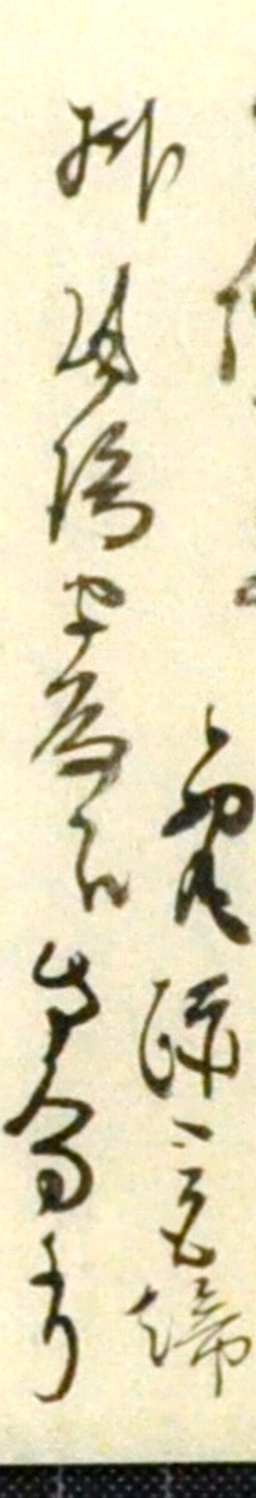掛備後守殿え自分より
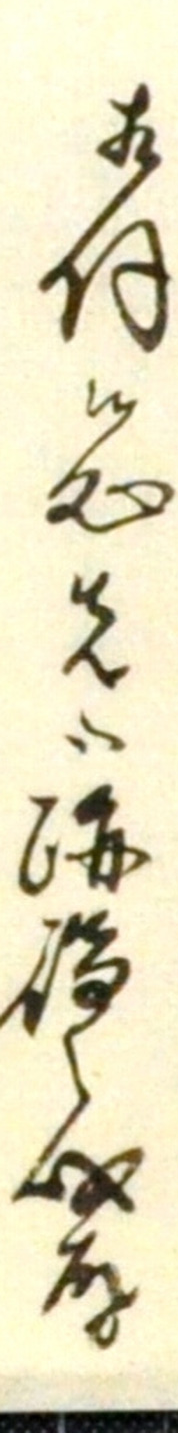相伺候処先御跡役之儀をも
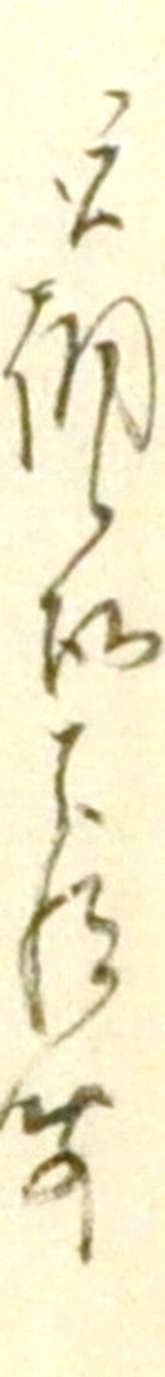取調候様被仰聞候
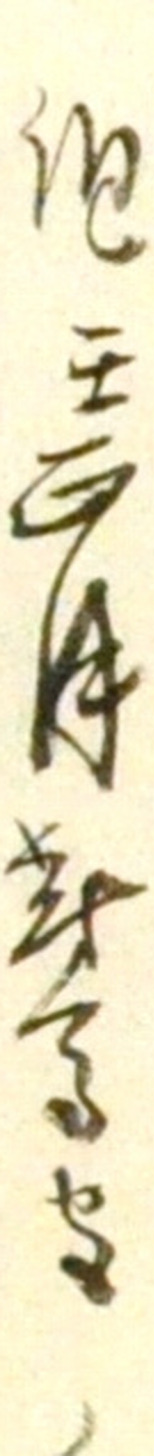但壬正月対馬守
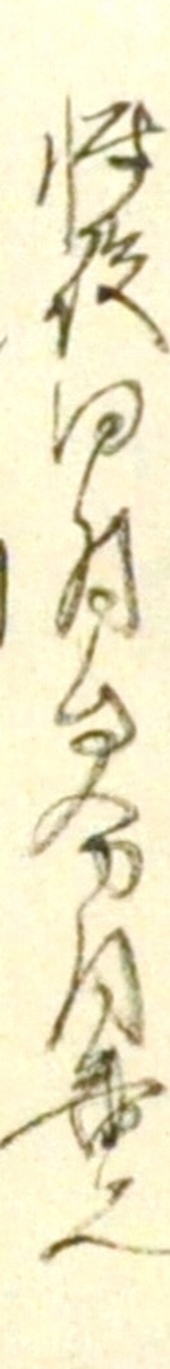傅役同月自分月番也
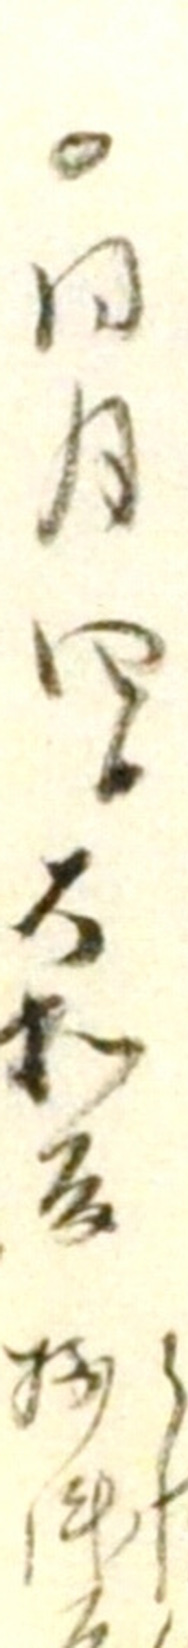○四月四日大和殿摂津殿
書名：万覚
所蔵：伊那市立高遠町図書館・合同会社AMANE
